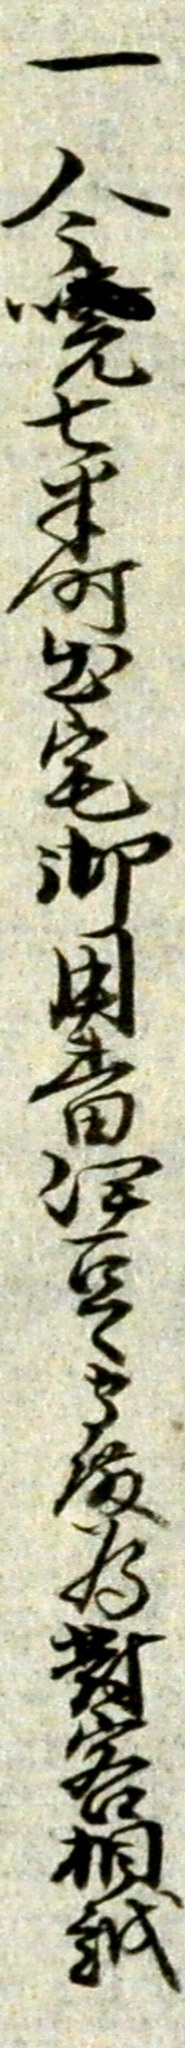一今暁七半時出宅御用番伊豆守殿為対客相越
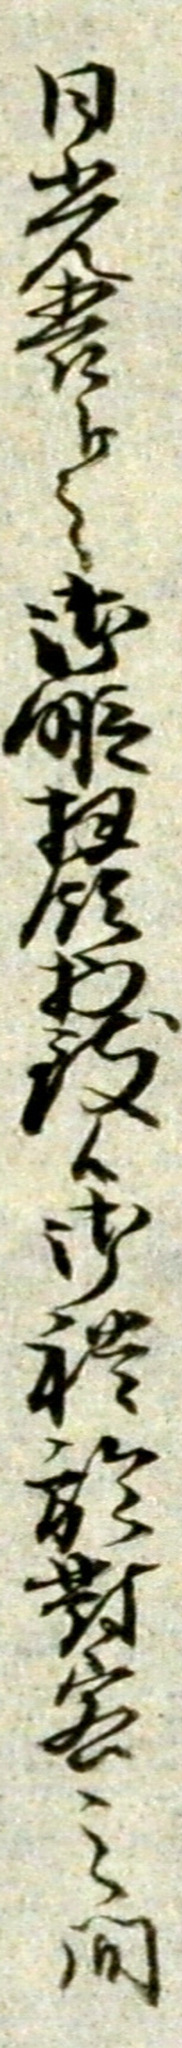日光表え之御暇拝領物致候御礼於対客之間
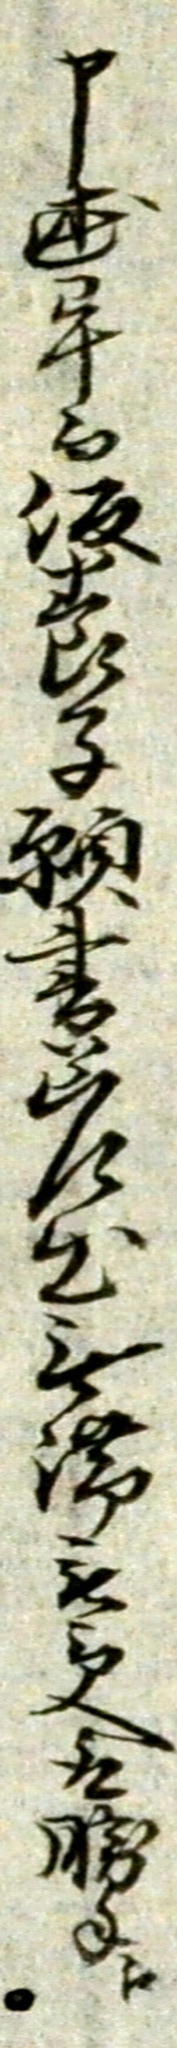申述畢而仮養子願書差出無滞被受取勝手江
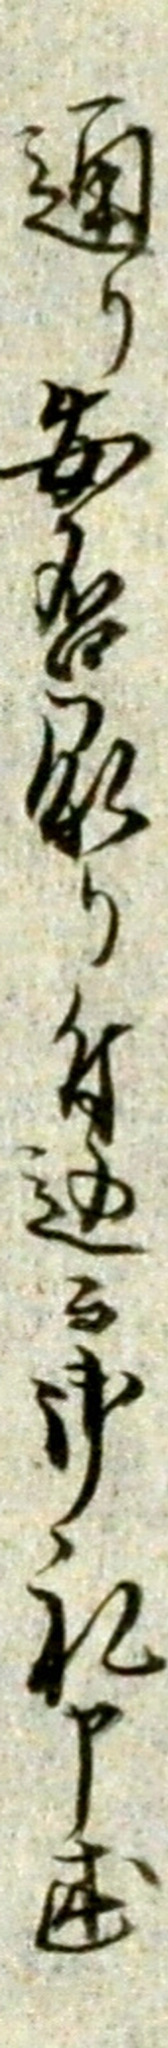通り安否承り付込而御礼申述
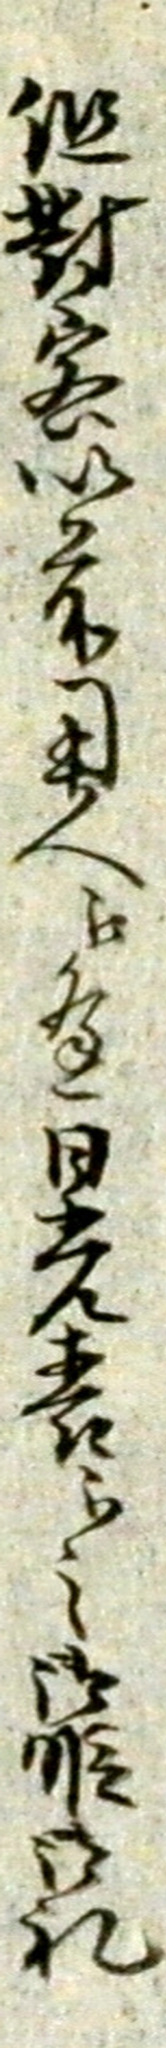但対客以前用人江逢日光表江之御暇御礼
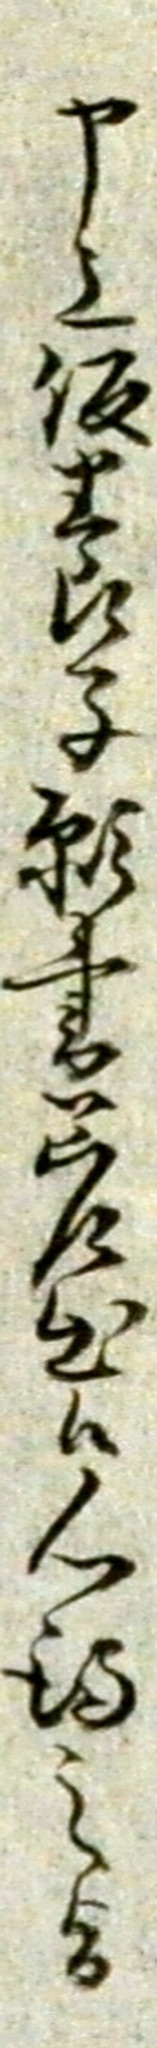申上仮養子願書差出候心得之旨
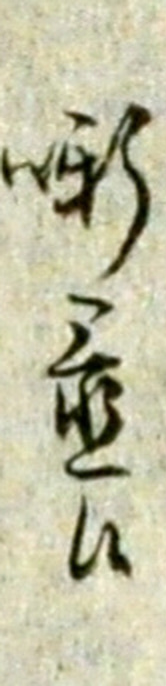噺置候
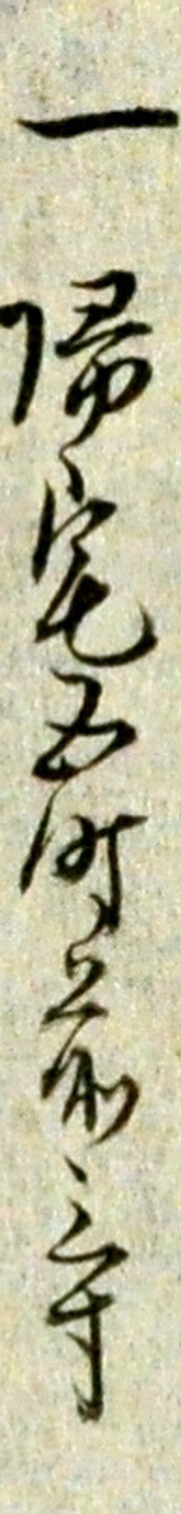一帰宅五時前三寸
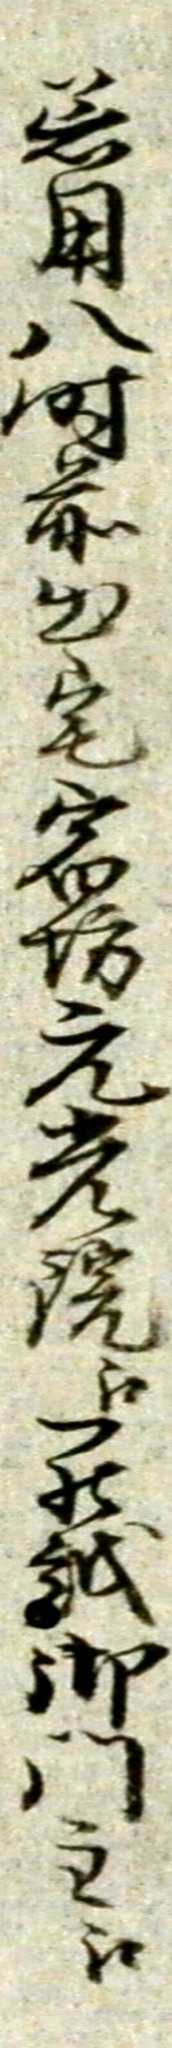着用八時前出宅宿坊元光院江罷越御門主江
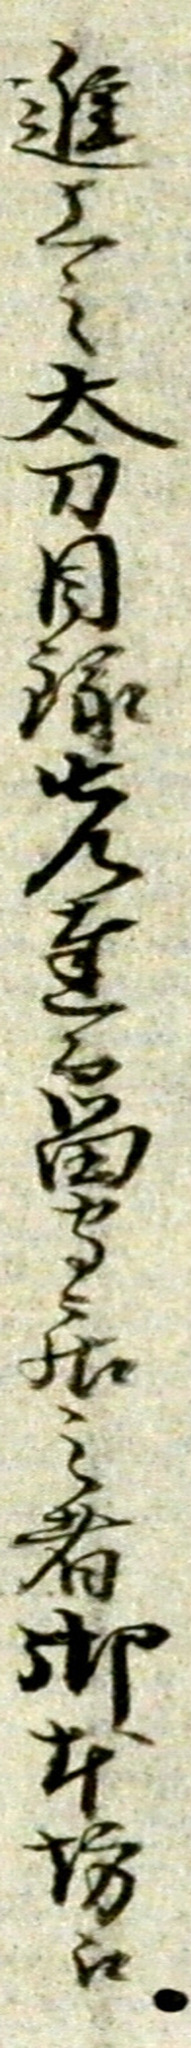進上之太刀目録先達而留守居之者御本坊江
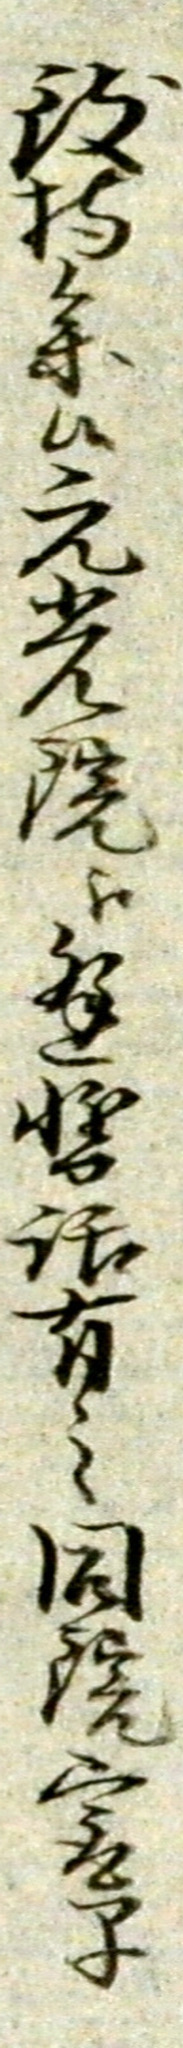致持参候元光院江逢暫話有之同院最早
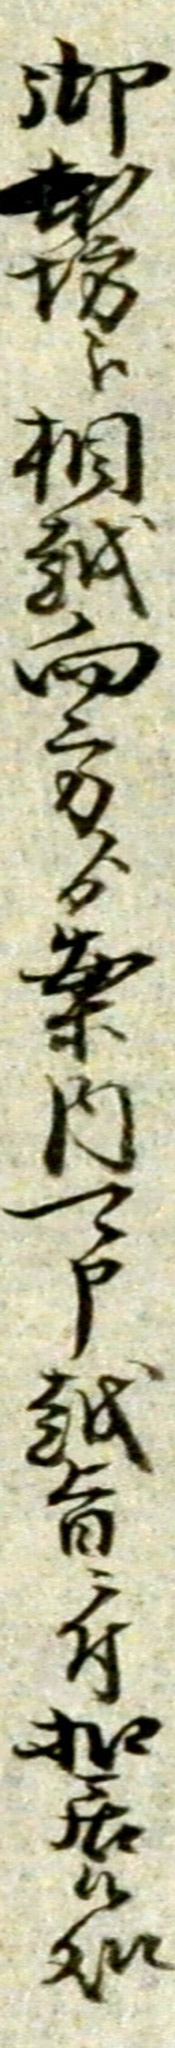御本坊江相越向方ゟ案内可申越旨ニ付扣居候処
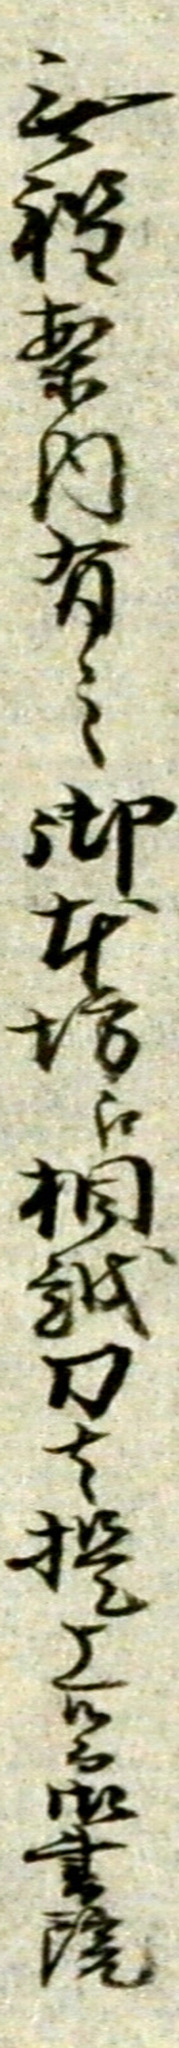無程案内有之御本坊江相越刀者提上候而御書院
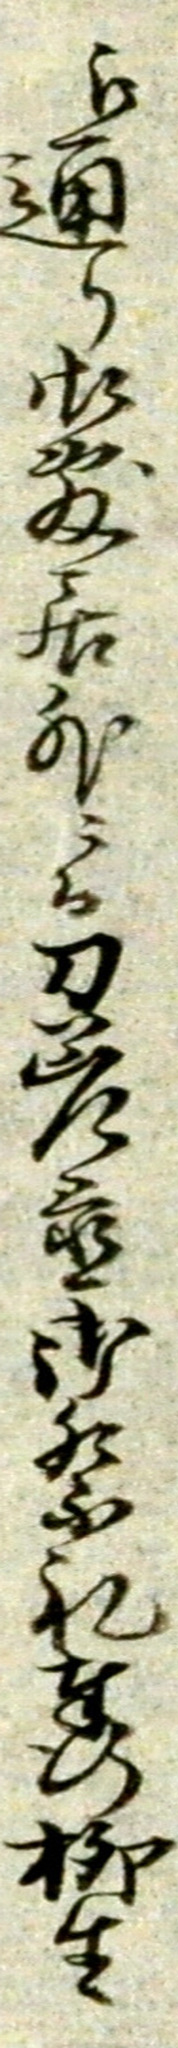江通り御敷居外ニ而刀差置御祭礼奉行柳生
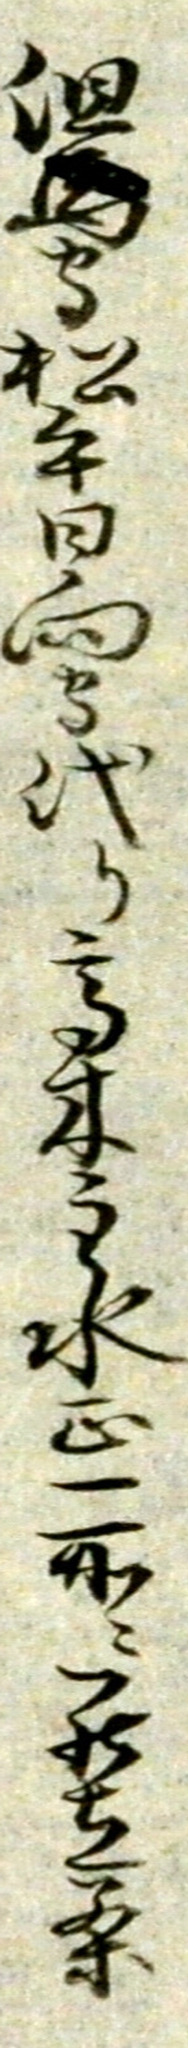但馬守松平日向守代り高木主水正一所ニ罷在茶
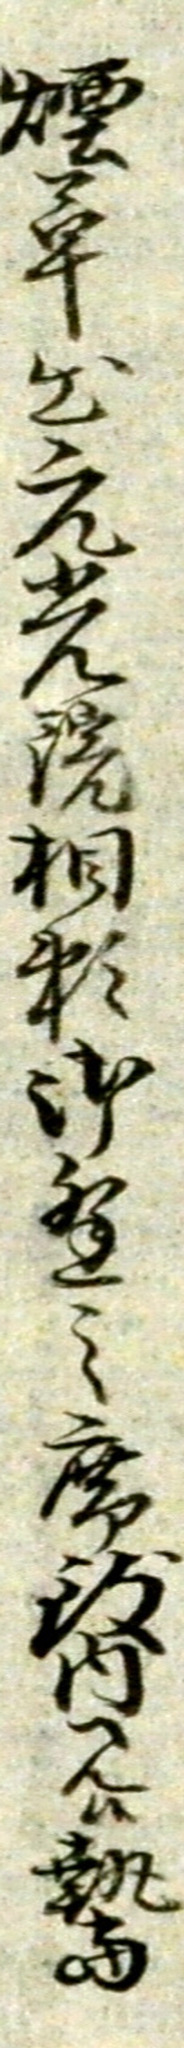煙草出元光院相頼御逢之席致内見候執当
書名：日光御名代相勤候節ノ留
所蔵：伊那市立高遠町図書館・合同会社AMANE
